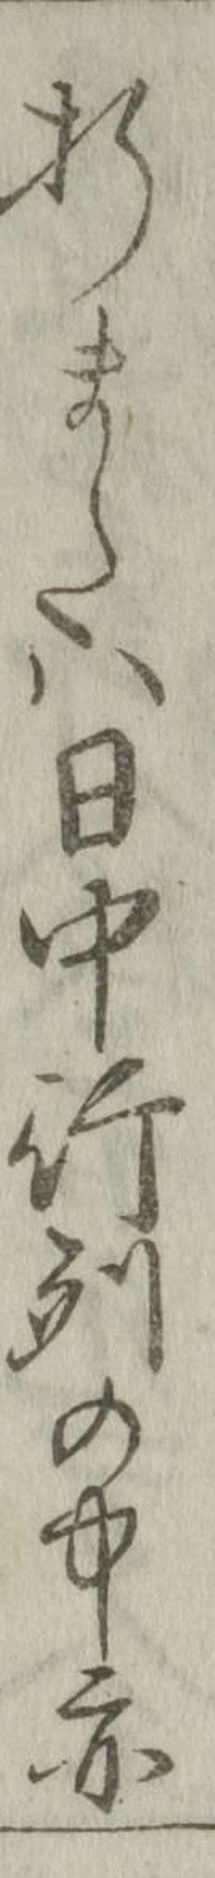折または日中行列の中亦
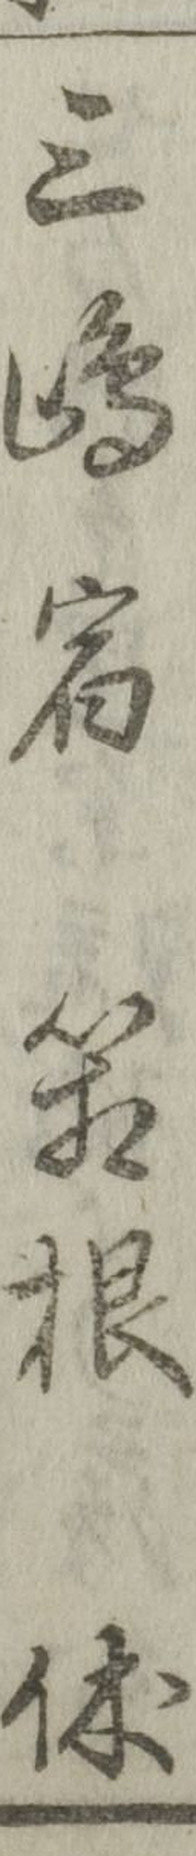三崎宿箱根休
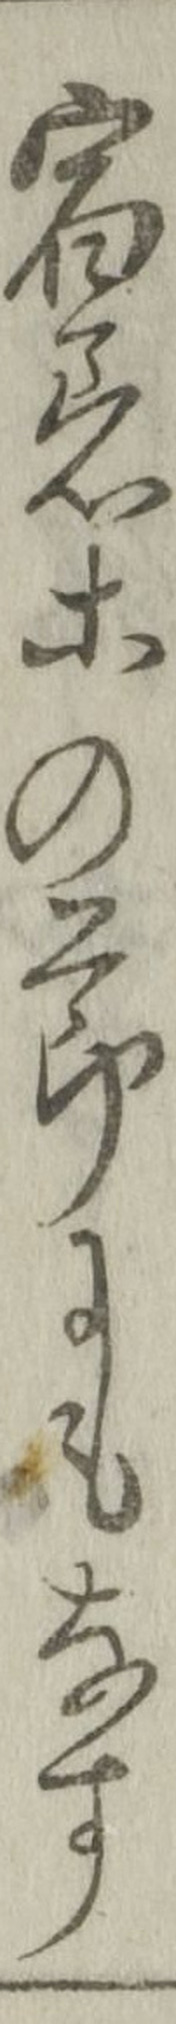宿着等の節にもなす
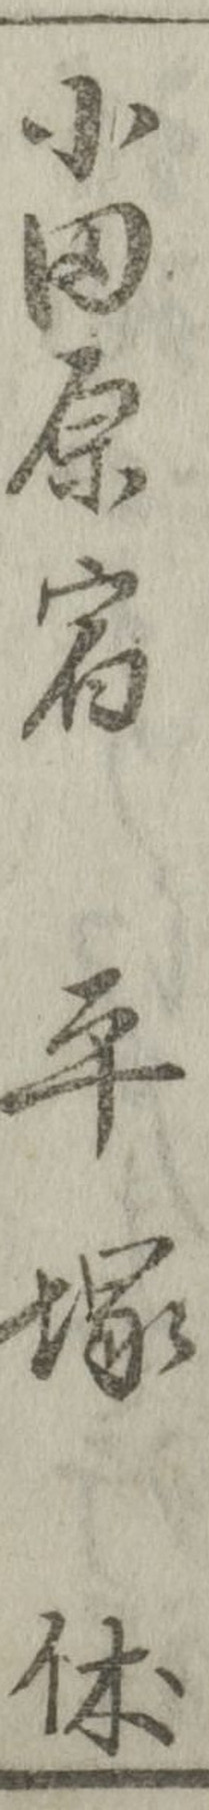小田原宿平塚休
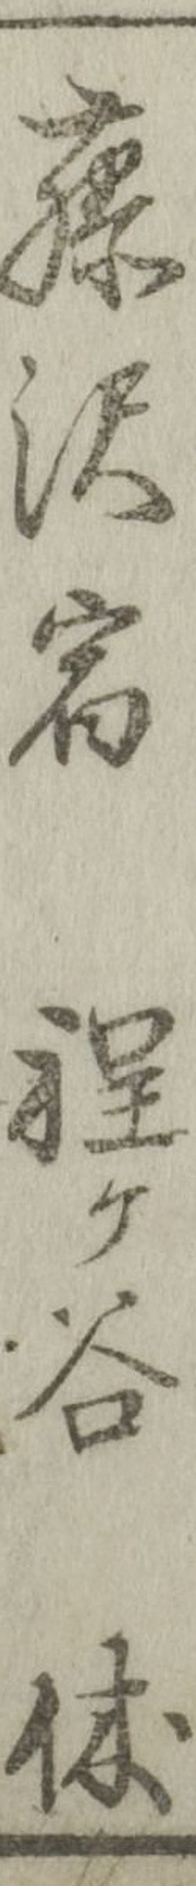藤沢宿程ヶ谷休
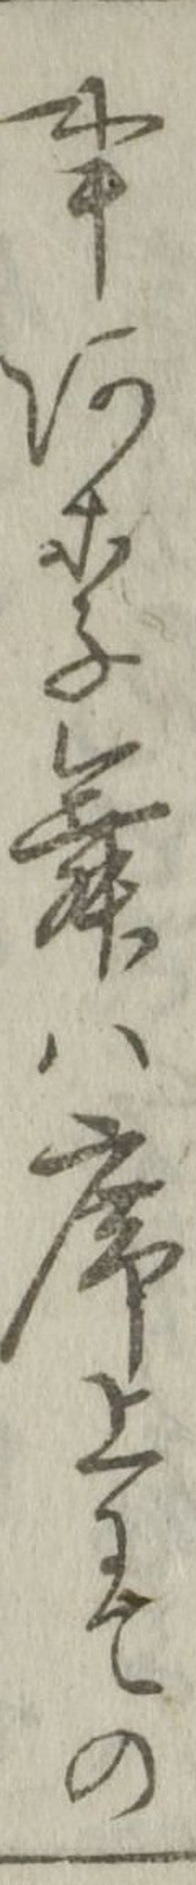事あり舞は席上にての
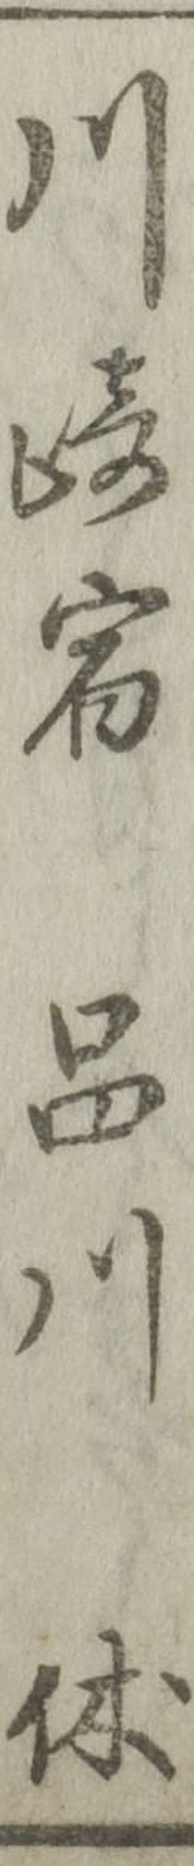川崎宿品川休
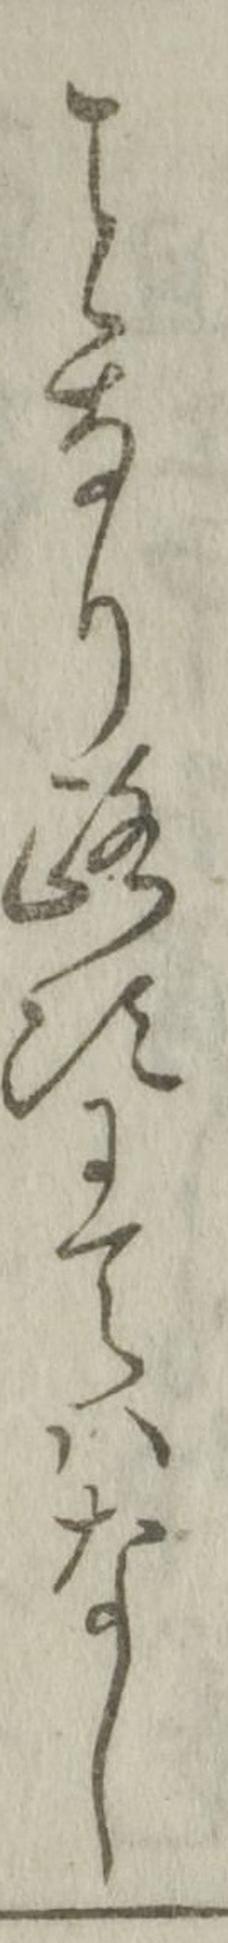ことなり路次にてはなし

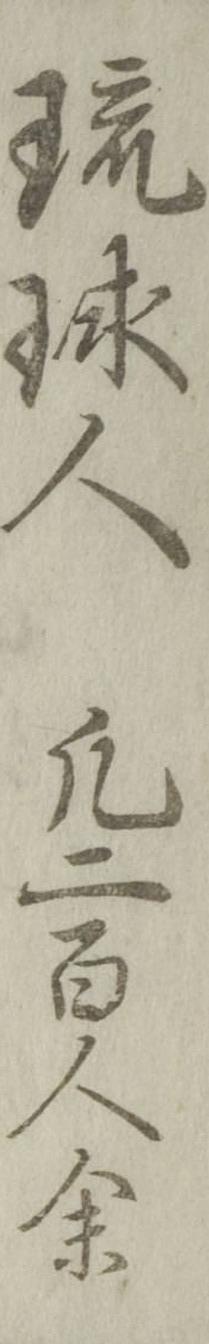琉球人凡二百人余
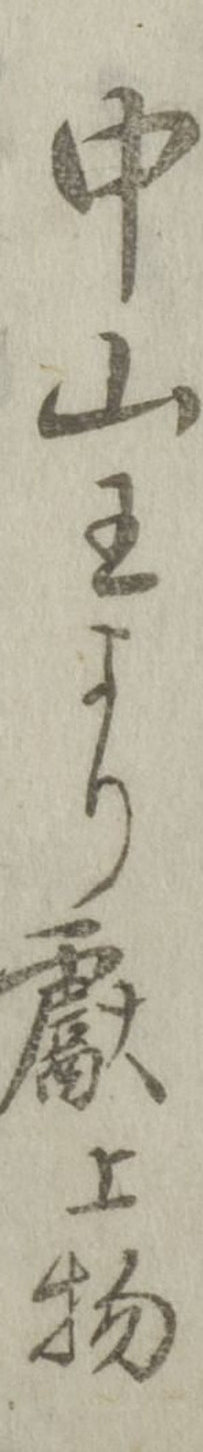中山王より獻上物
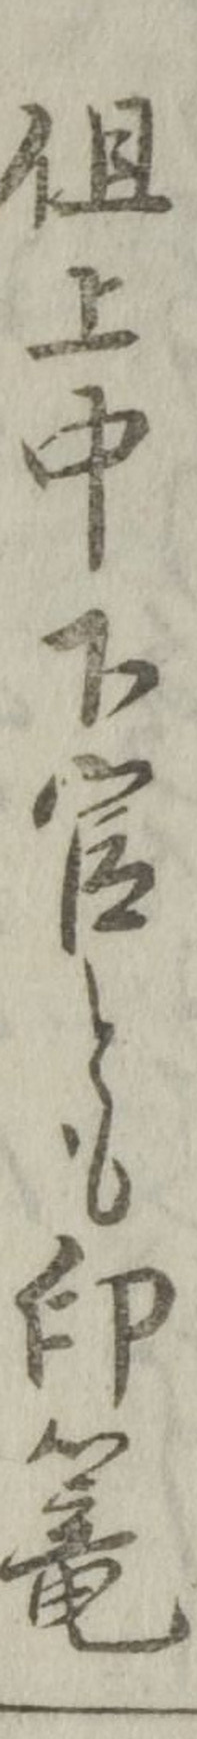但上中下官とも印篭
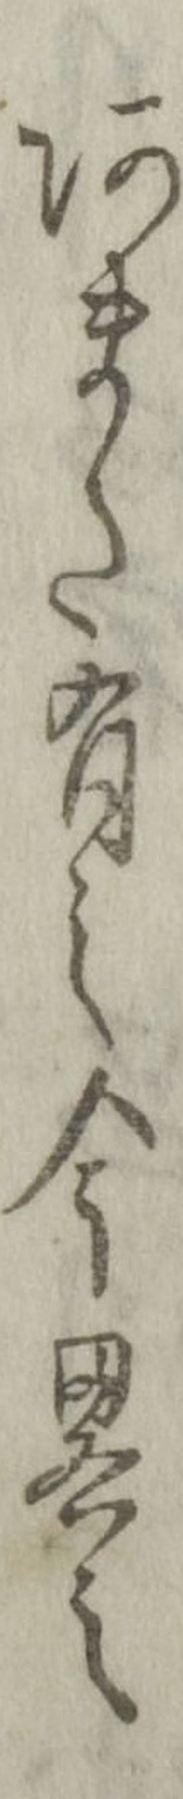あまた有之今略之
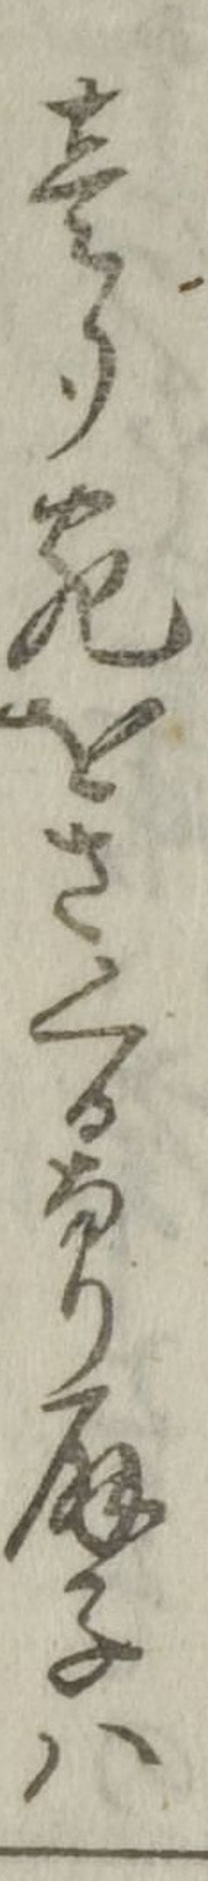壱つ宛をさくるなり辟子は
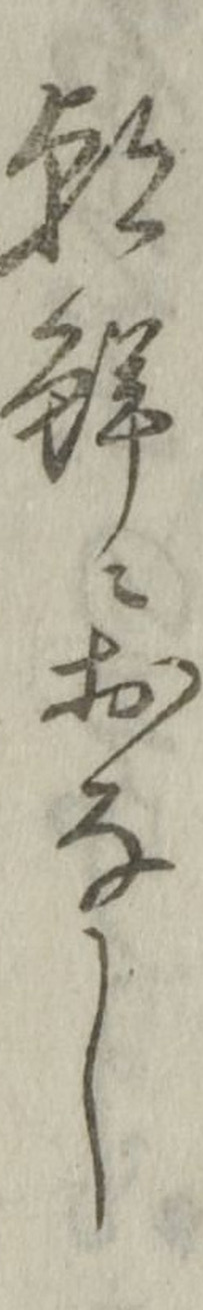朝鮮におなし
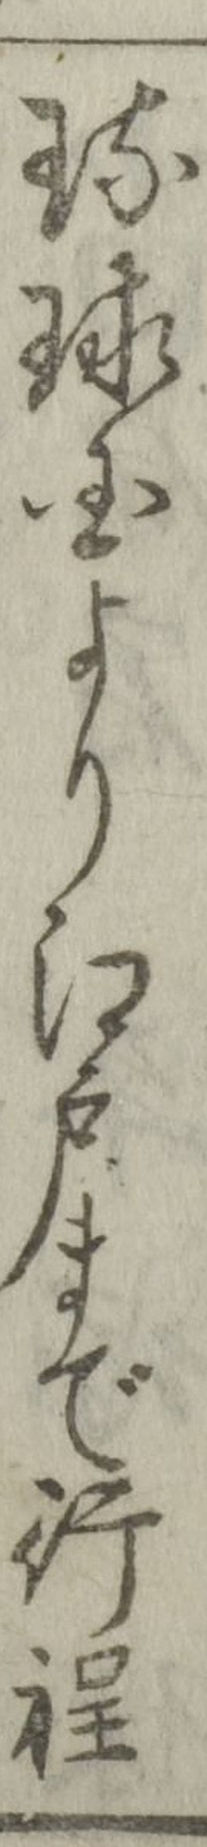琉球国より江戸まで行程
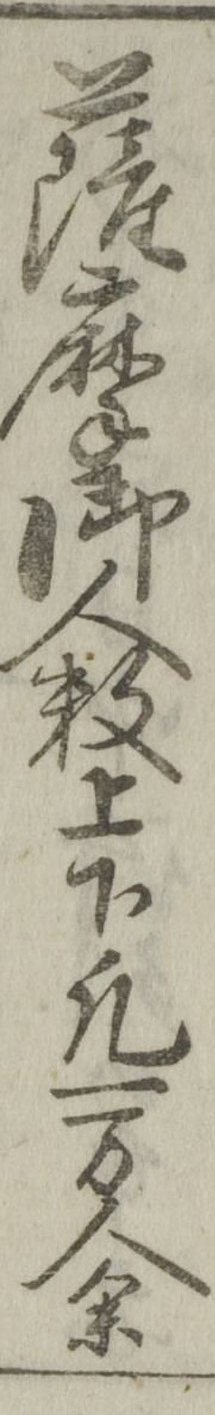薩摩御人数上下凡一万人余
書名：琉球人行列記 天保3年
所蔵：University of the Ryukyus Library
